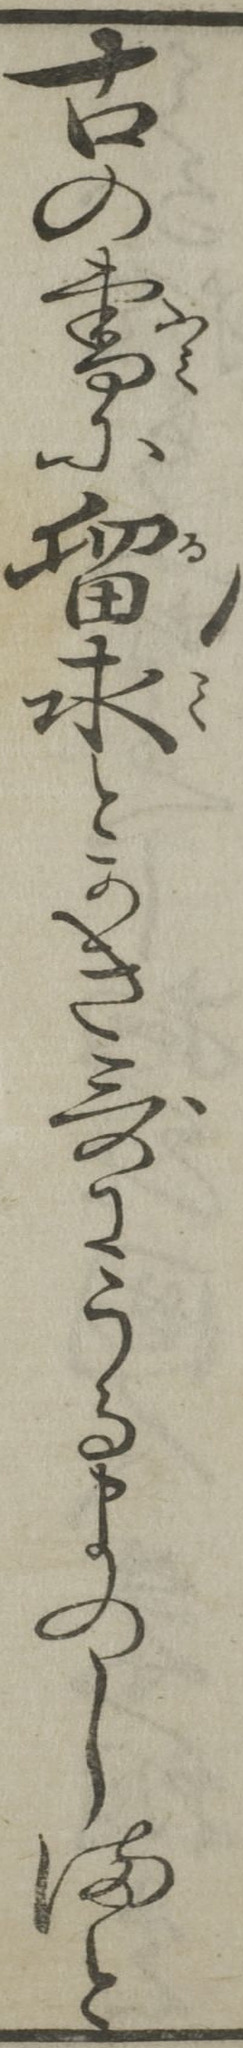古の書に留求とかき哥にうるまのしまと
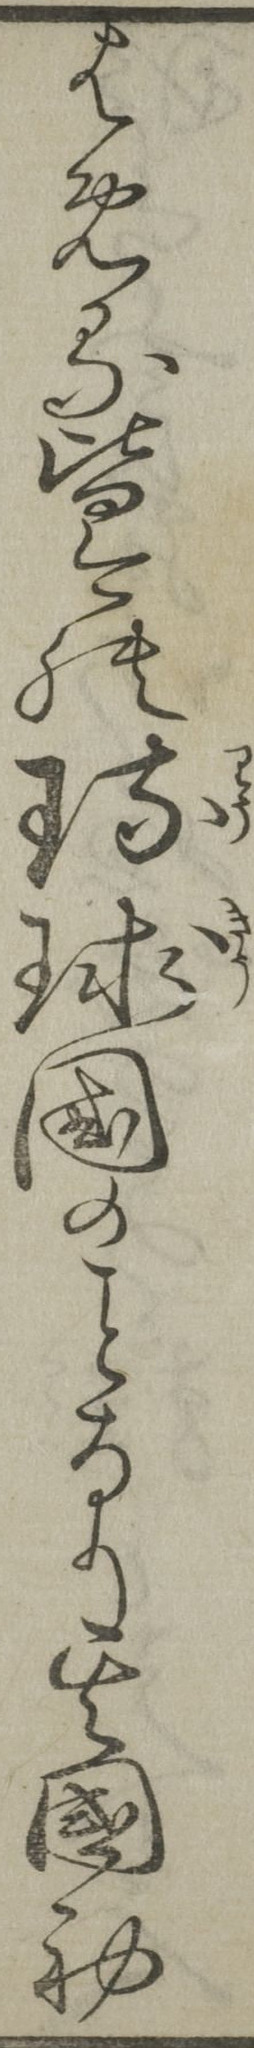よめる皆今の琉球國のことなり其國初
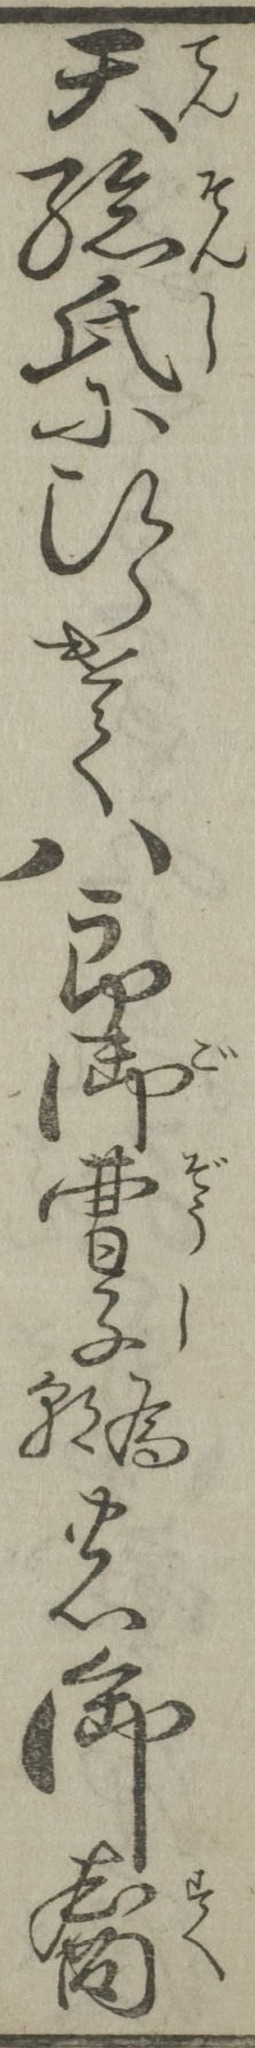天孫氏にひらけて八郎御曹子為朝の御裔
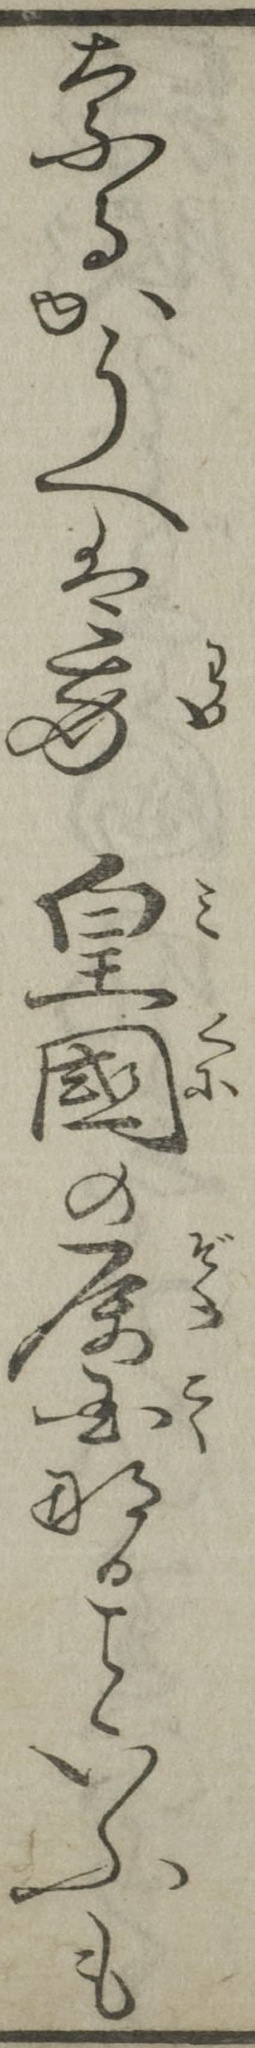なるかうへは我皇國の属国なることいふも
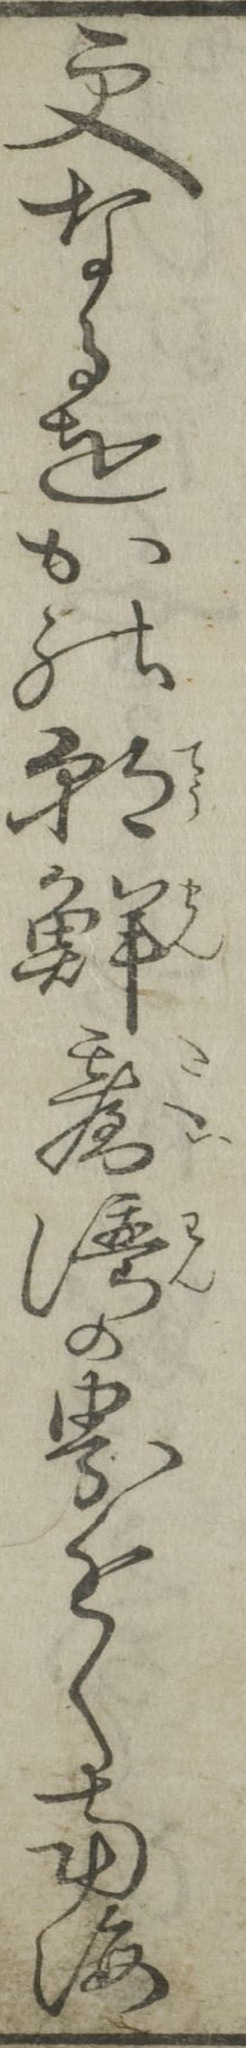更なるをかの朝鮮臺湾の界近く南海
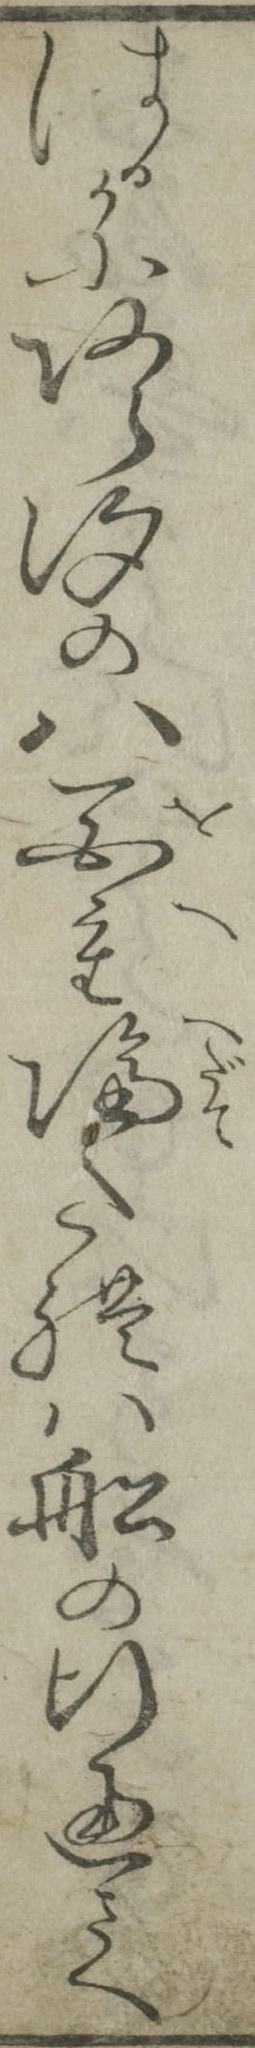はるかにあら汐の八百重隔たれは船の行通さへ

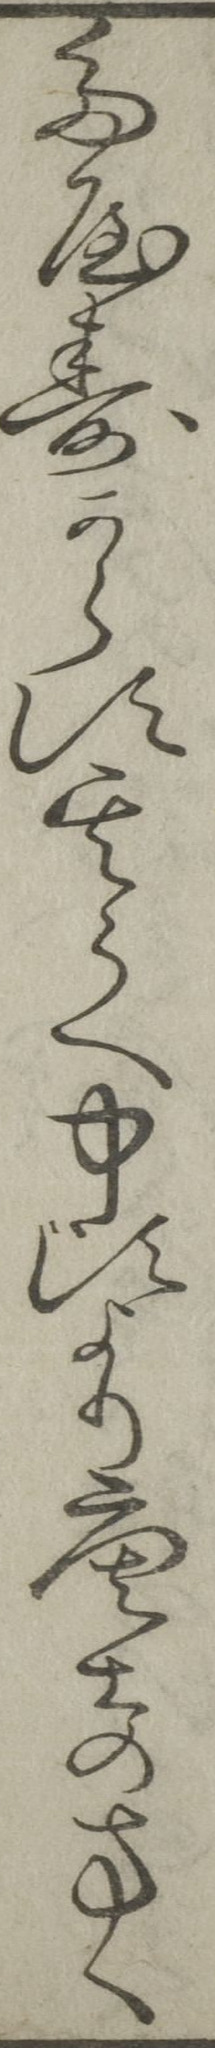たやすからす其うへ中頃より唐土のすく
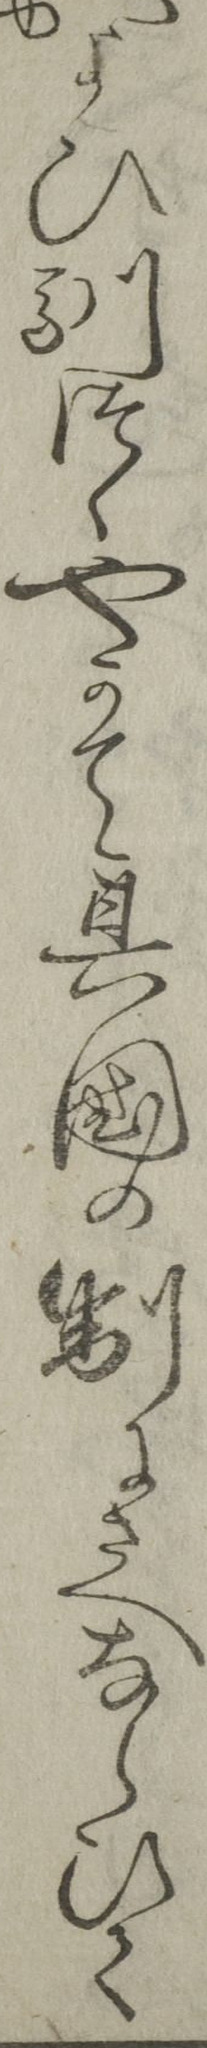かよひ馴つゝやかて其國の制にさへならひて
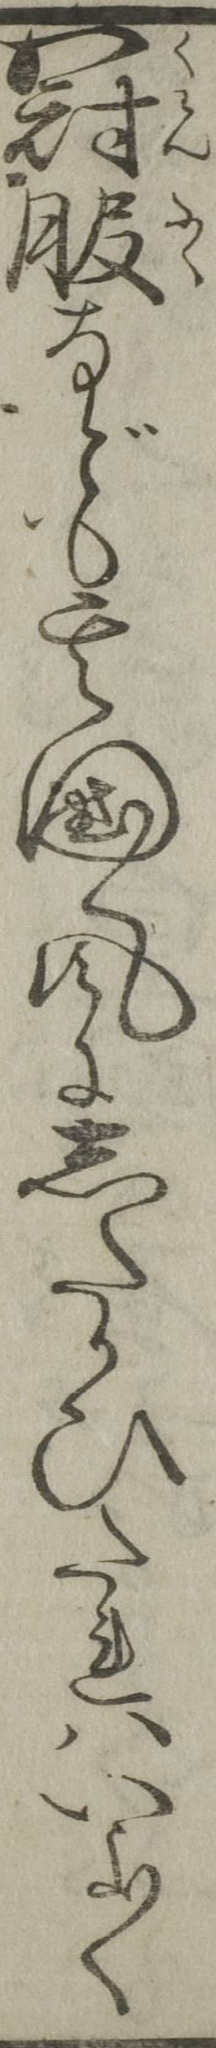冠服なども其國風にしたかひたれはいよ〳〵
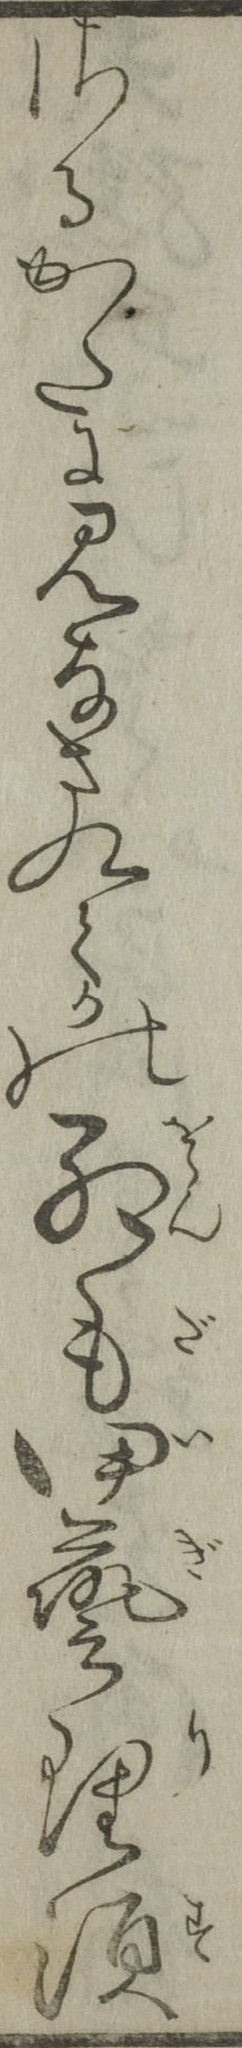さるかたに見なされてかの紅毛伊藝理須
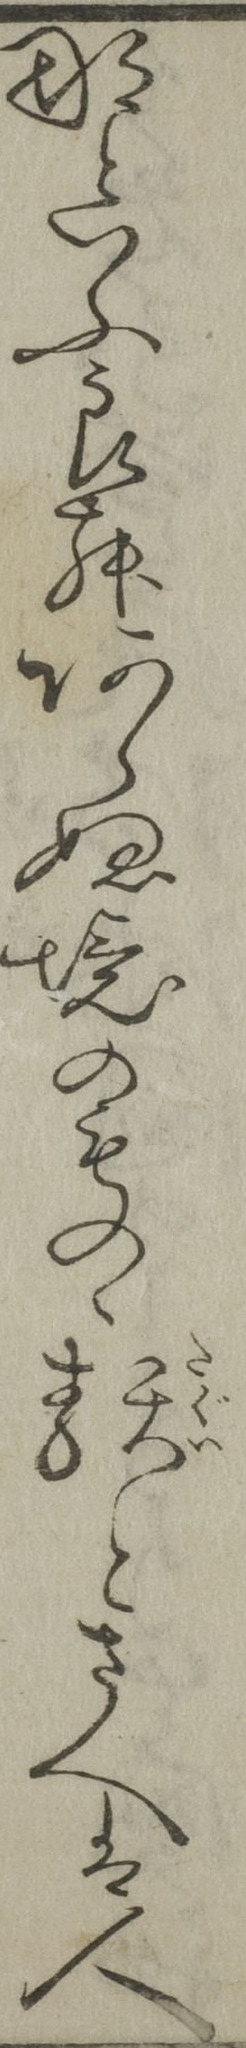なといふらむあらぬ境のものゝ類とさへは人
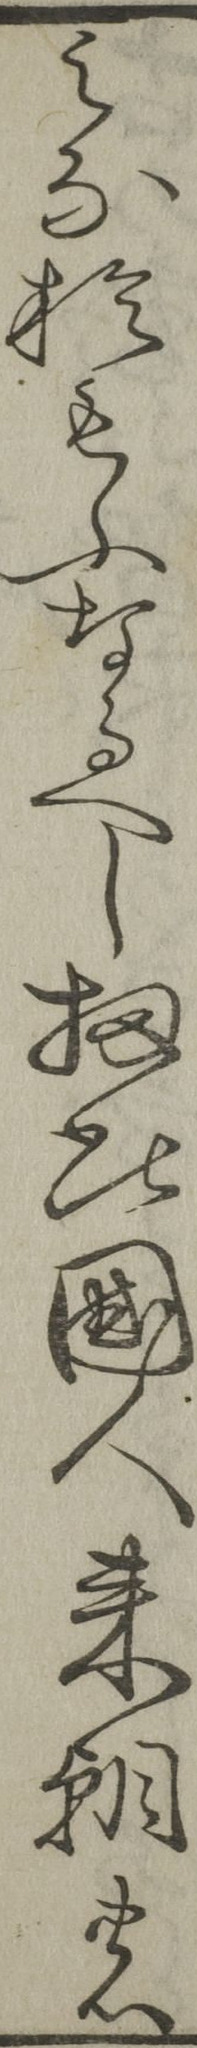みなおもふなるへし扨此國人来朝の
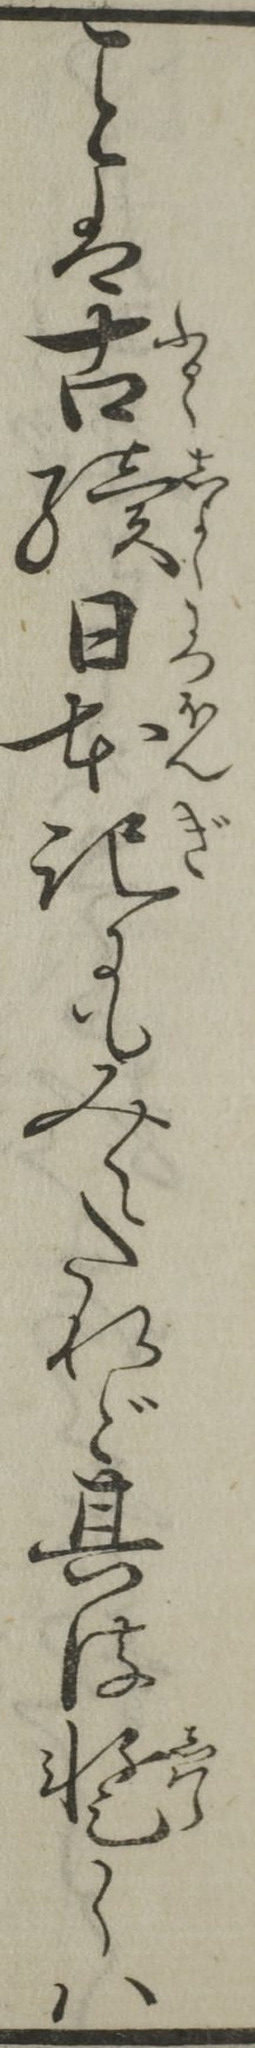ことは古続日本記にもみえたれど其後暫くは
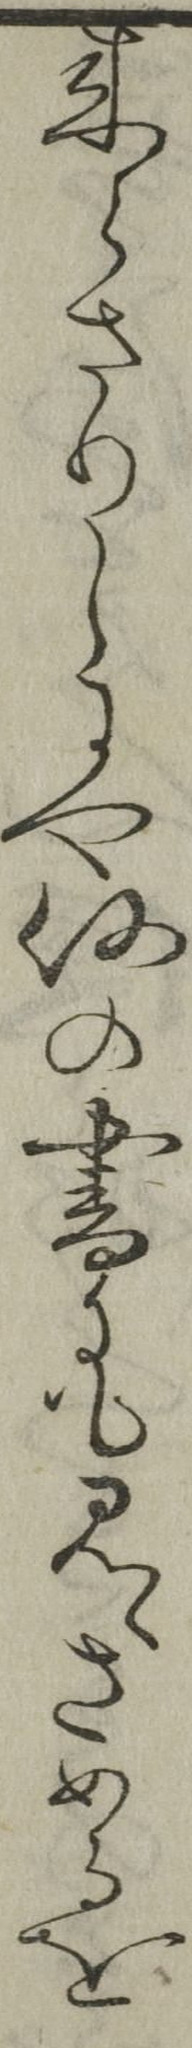来らさりしにや何の書にも見えさめるを
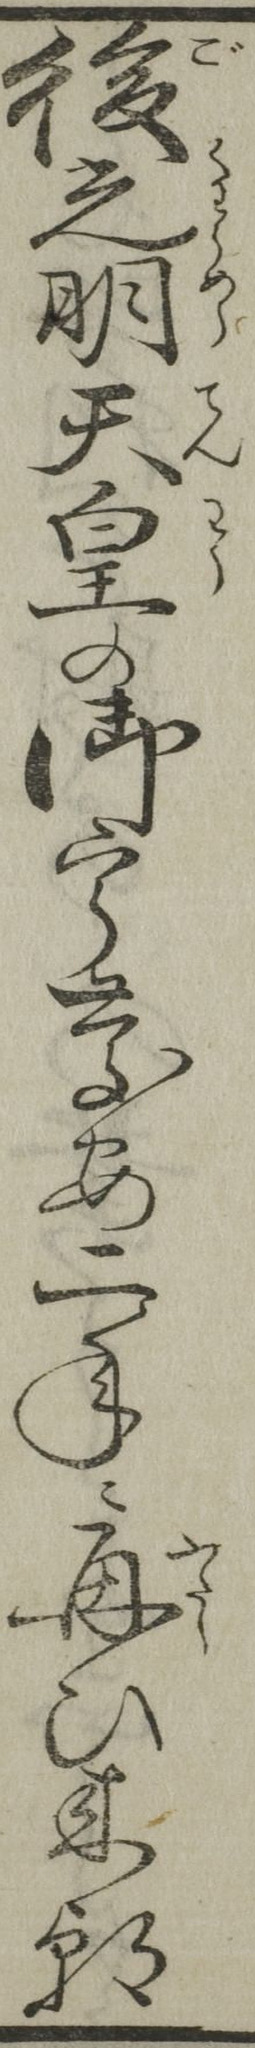後光明天皇の御宇慶安二年に再ひ来朝
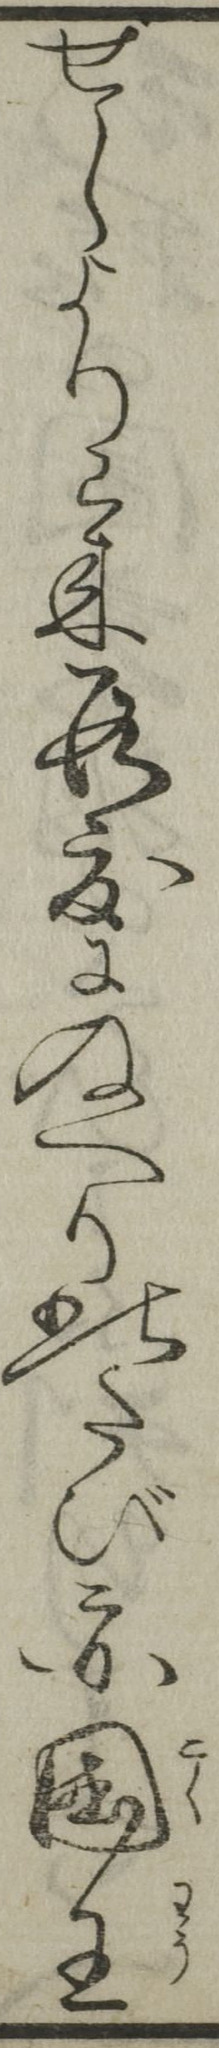せしより已来毎度に及へり此たび亦国王
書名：琉球人行列記 天保3年
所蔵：University of the Ryukyus Library
